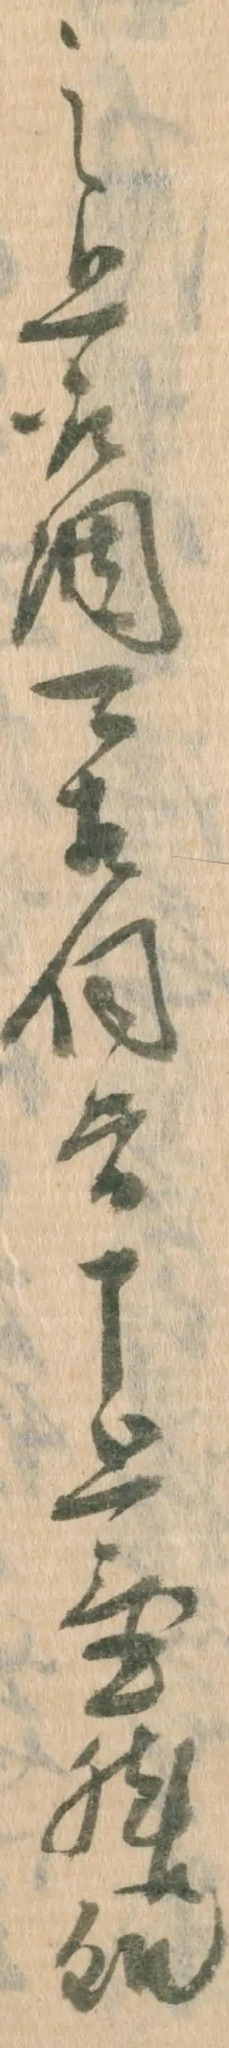之上取調可相伺旨申上置然ル処
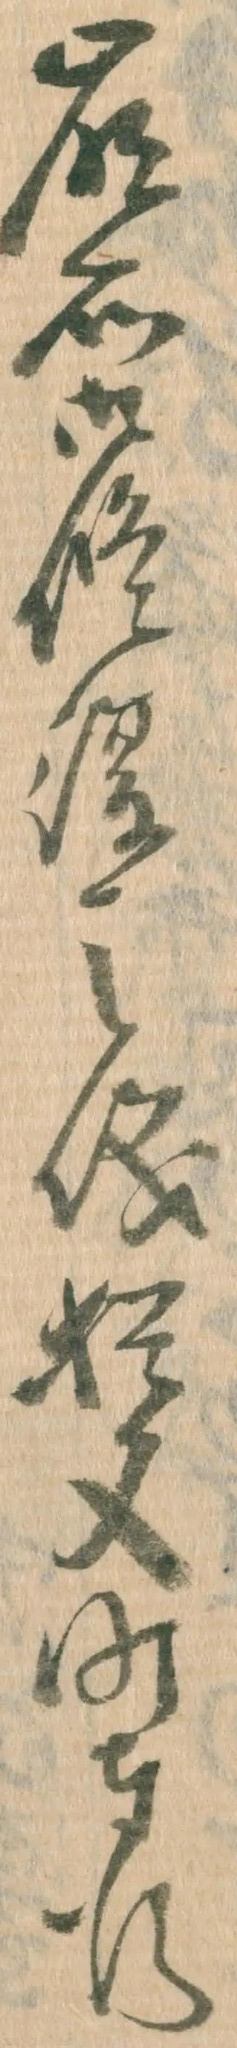崩所御修復之儀猶又町奉行
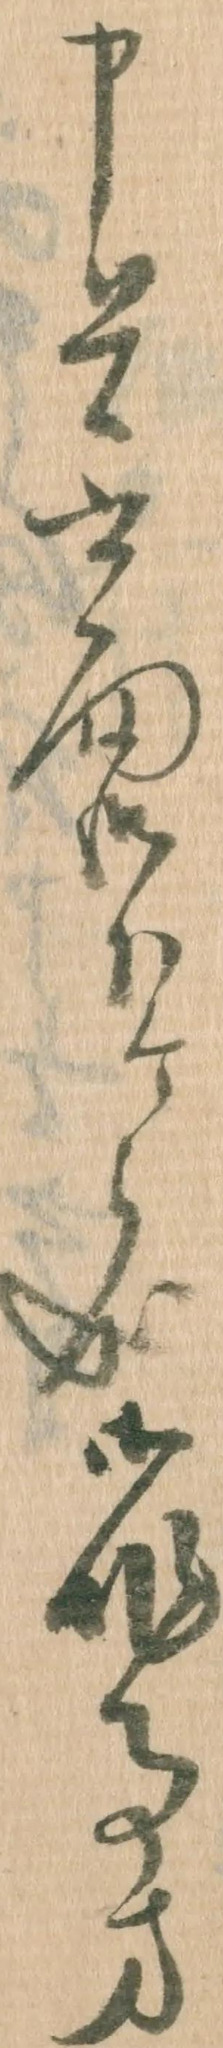申上候書面御下ケ被成御作事方
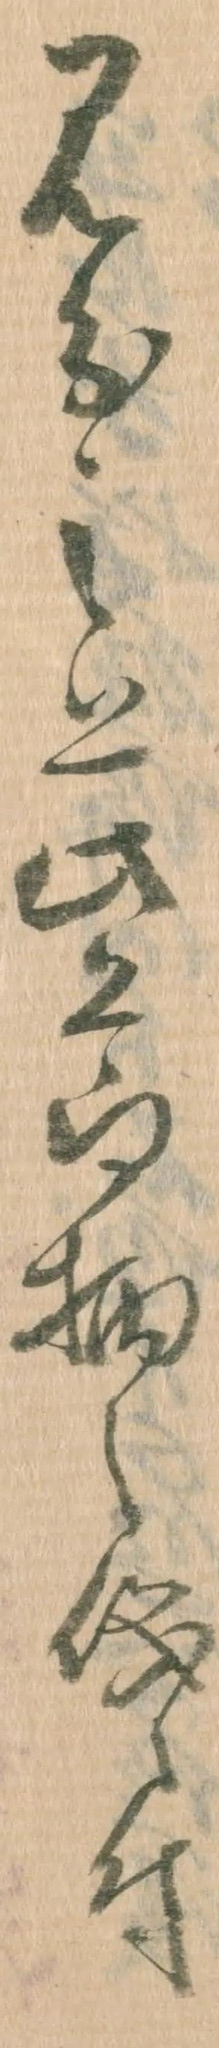見分之上此節柄之儀ニ付
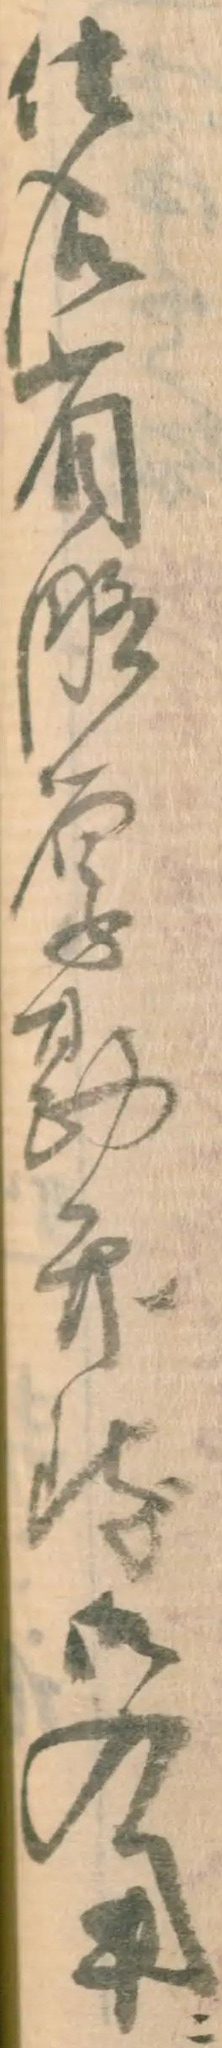仕様省略厚勘弁致し御入用ニ
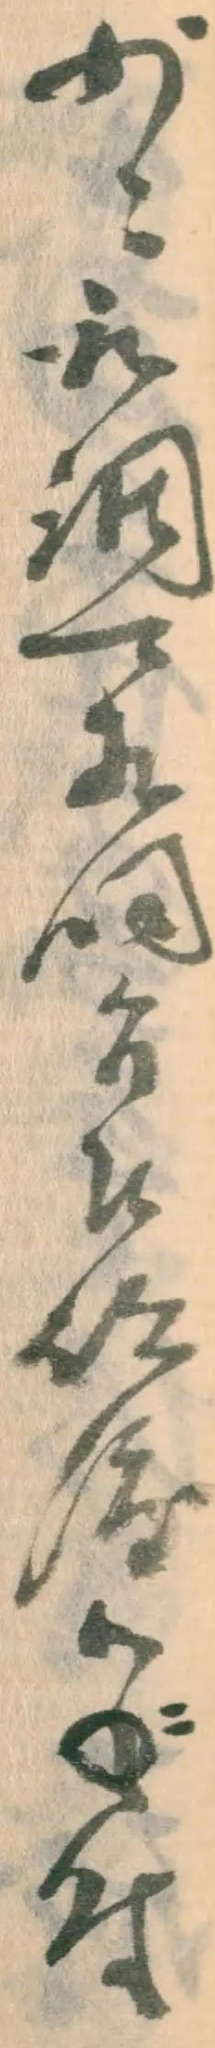少〻取調可相伺旨被仰渡候ニ付
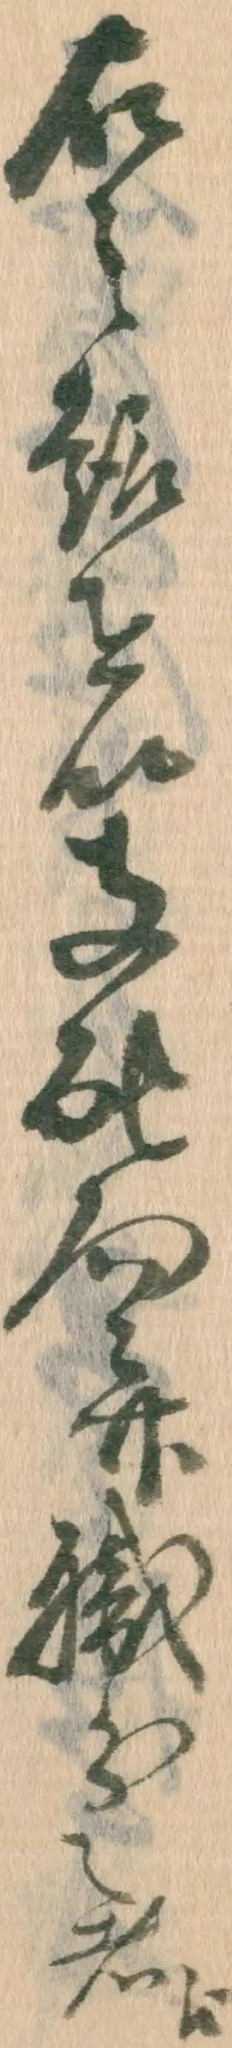右之趣を以支配向幷職分之者え
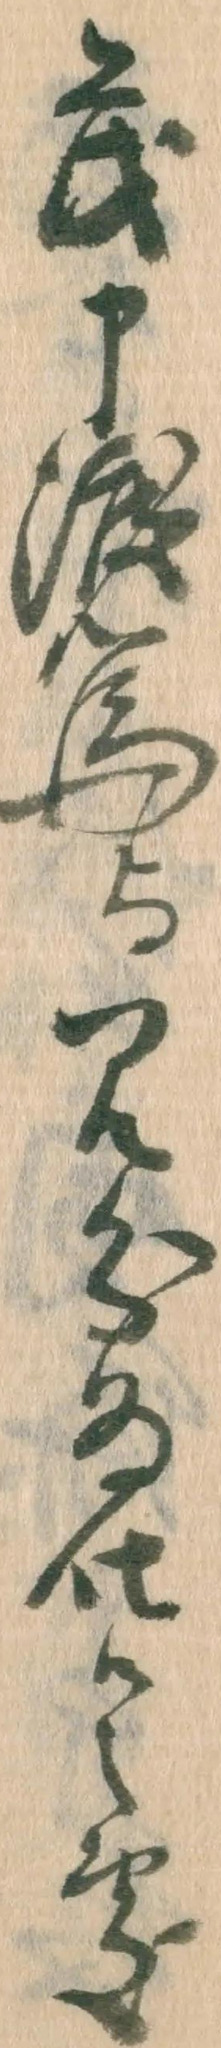も申渡篤と見分為仕候之処
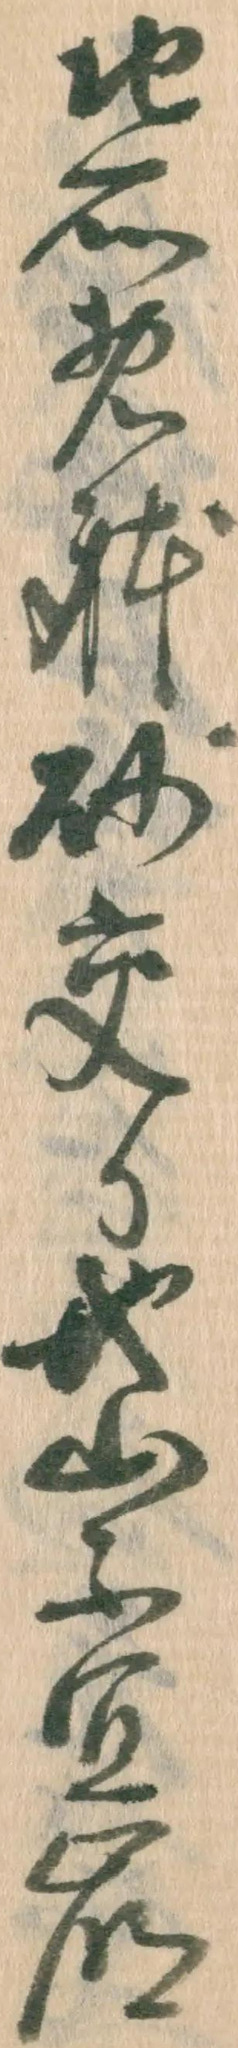地所惣体砂交り地山不宜崩
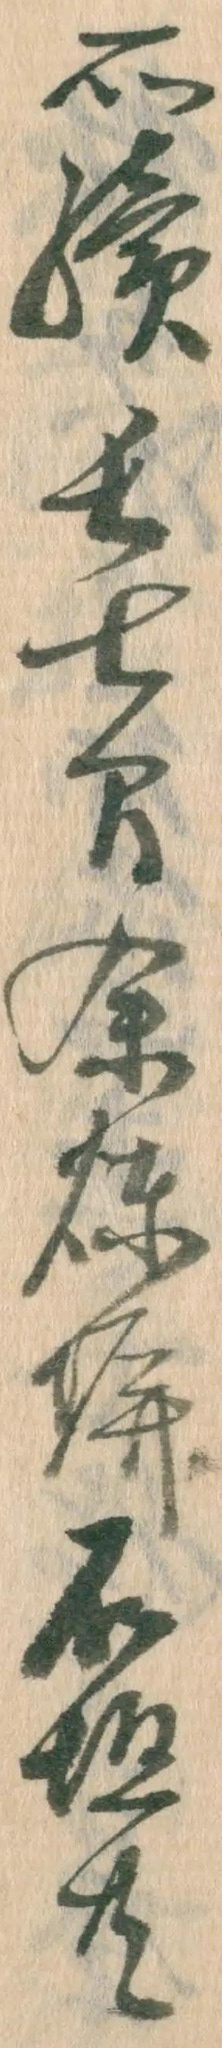所続長七間余煉塀石垣共
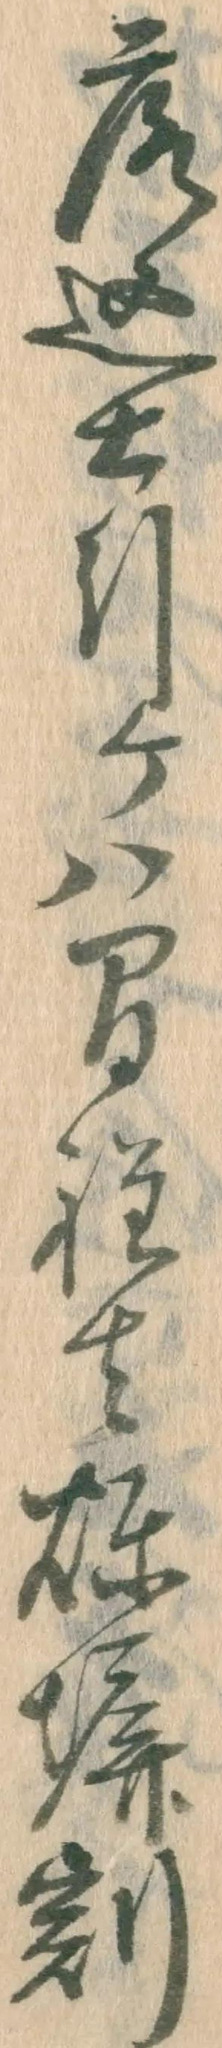落込大引ケ八間程は煉塀割

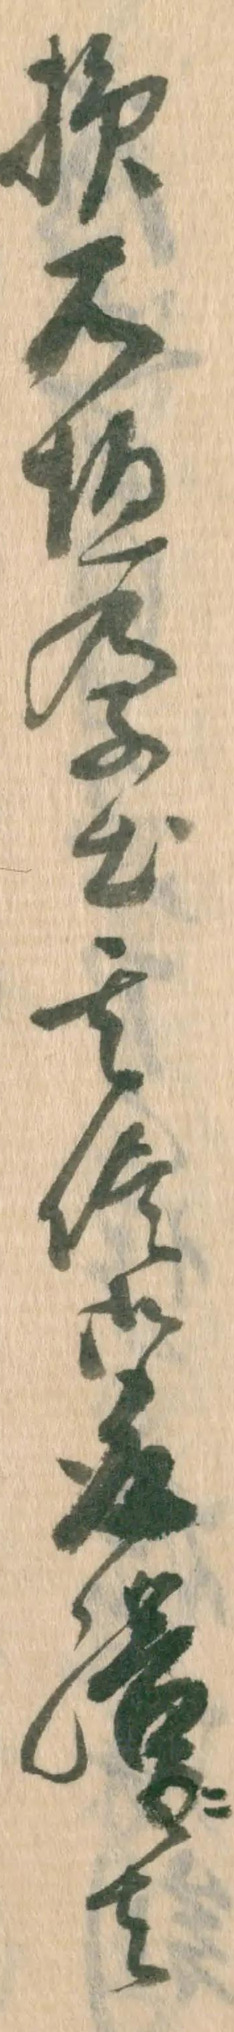損石垣孕出其儘御取繕ニは
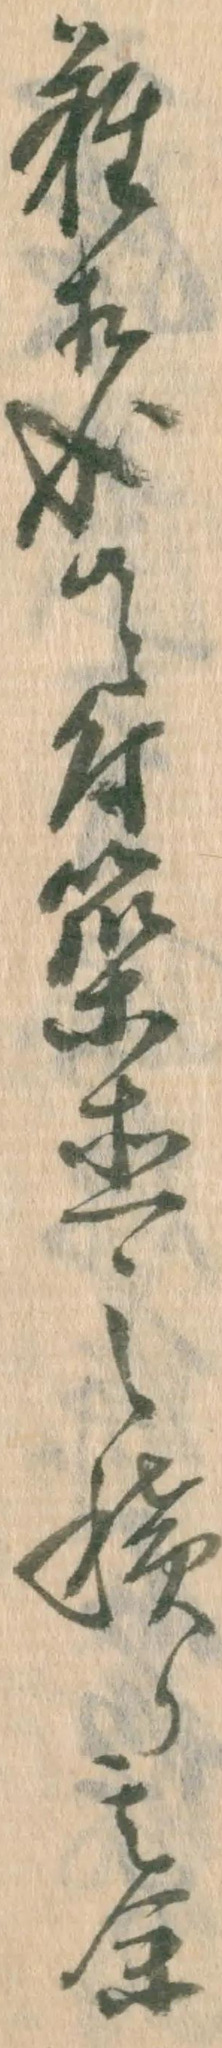難相成候ニ付築直之積り其余
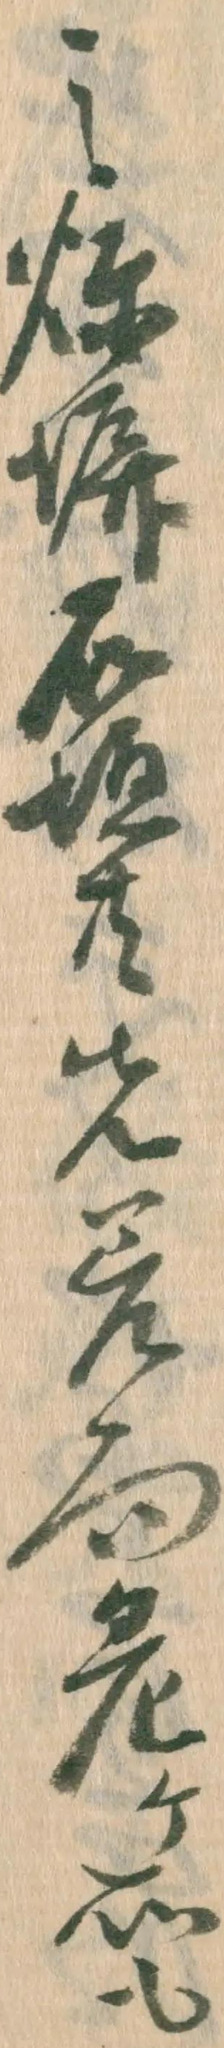之煉塀石垣共差向危ケ所も
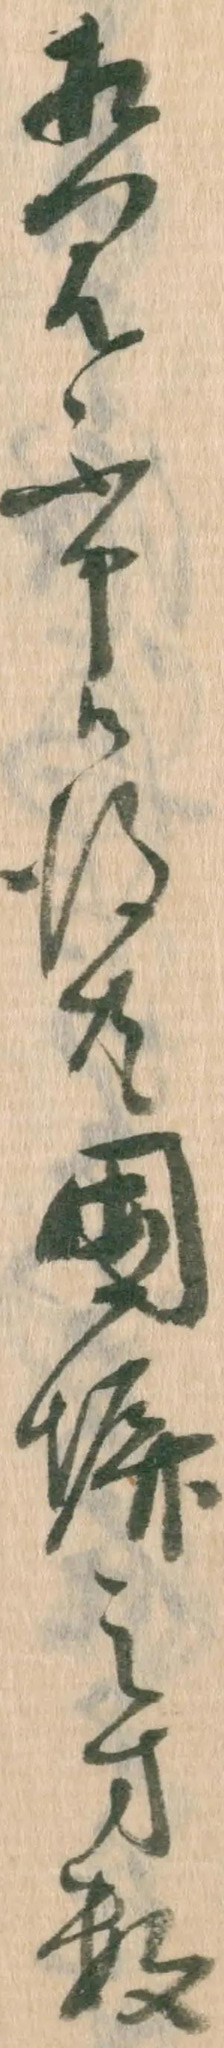相見不申候得共囲塀之方数
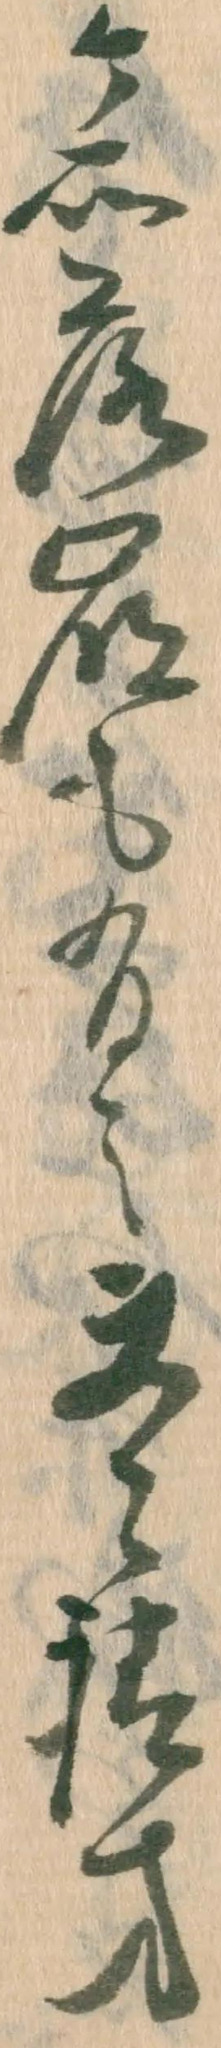ケ所落崩も有之序積方
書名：七十冊物類集 71巻. [44] 四十三 牢屋敷御普請御修覆地震ニ付骨折候牢屋掛御褒美之部
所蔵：国立国会図書館 National Diet Library, JAPAN
